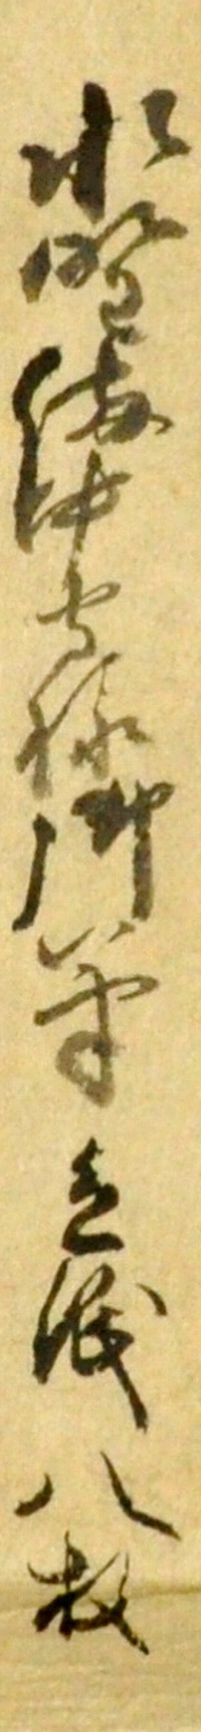水野備中守様御筆色紙八枚

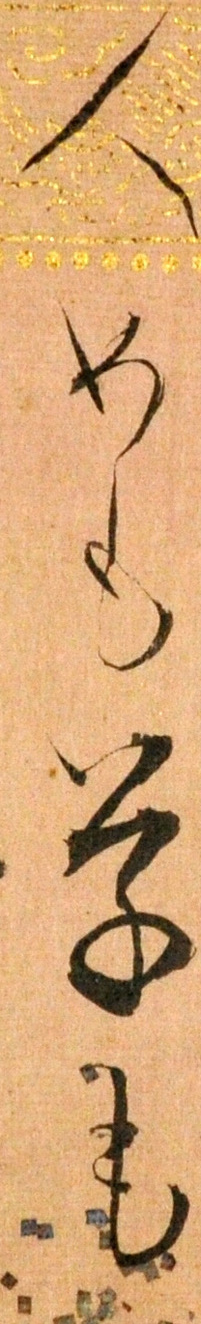人めも草も
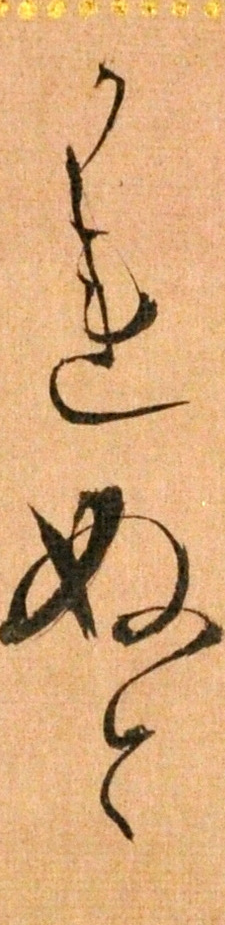かれぬと

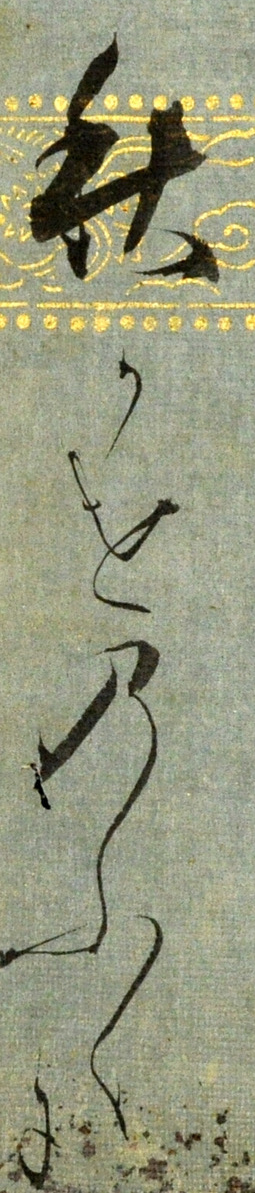秋かせのふくに
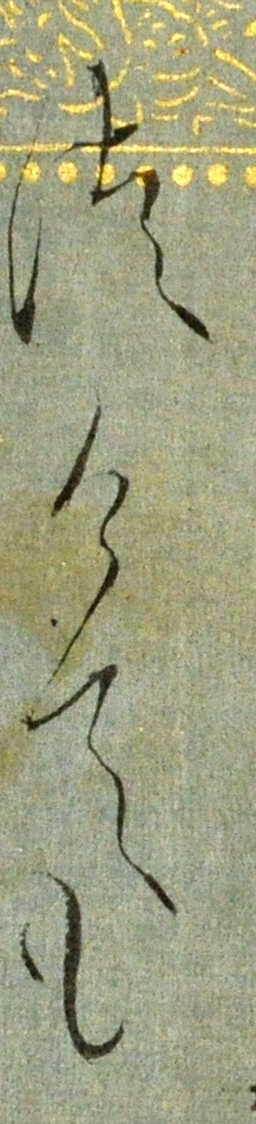つけても
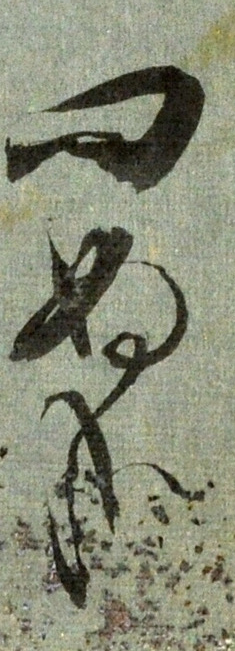問ぬ哉
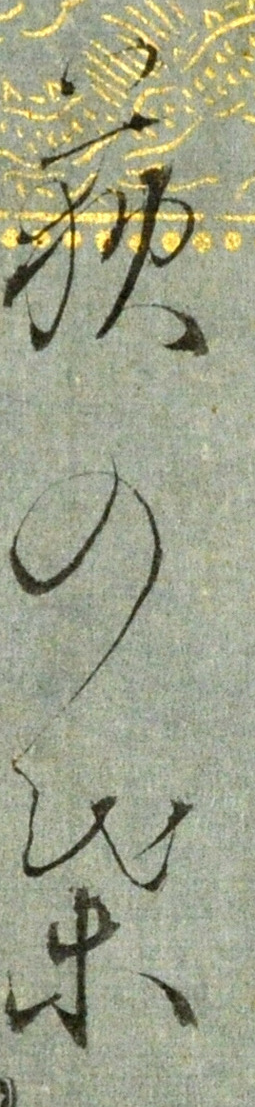荻の葉
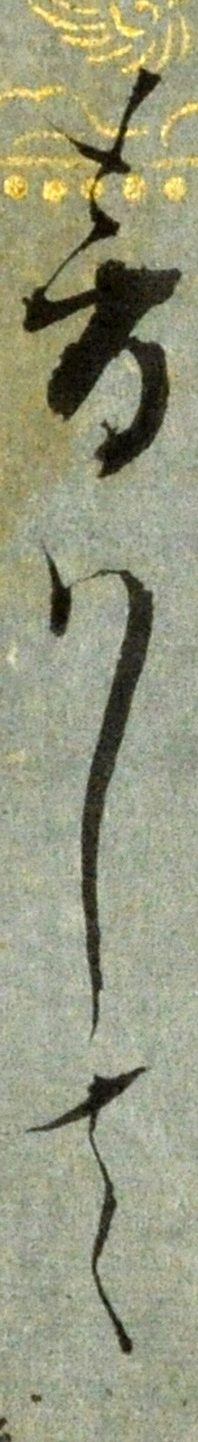音はして

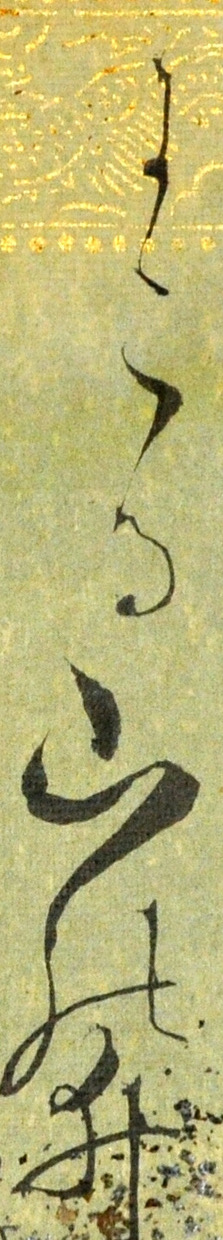にこる山の井の

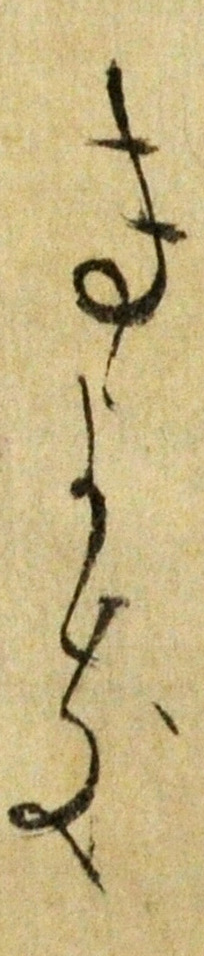きよき
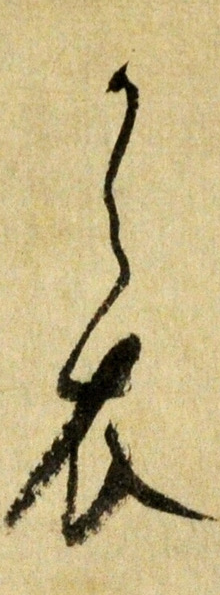から衣
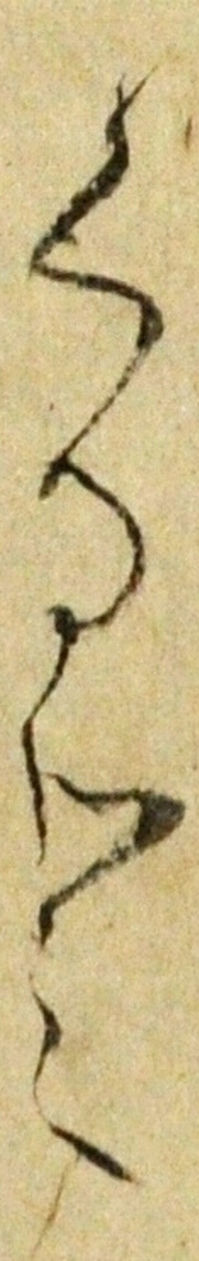くると
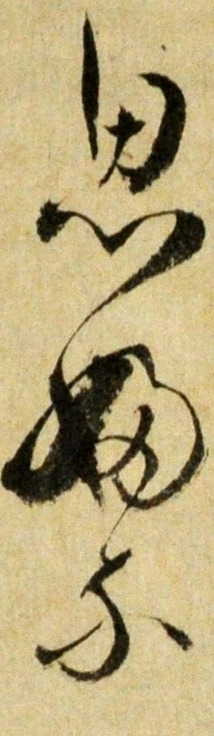思ふな
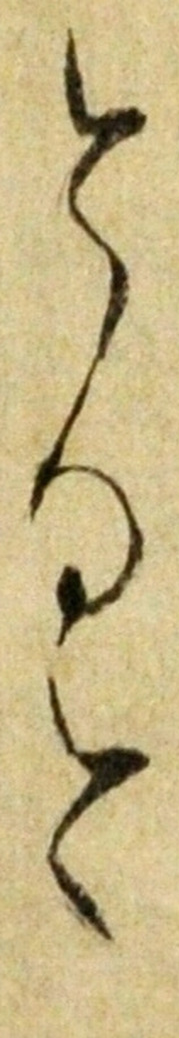とると

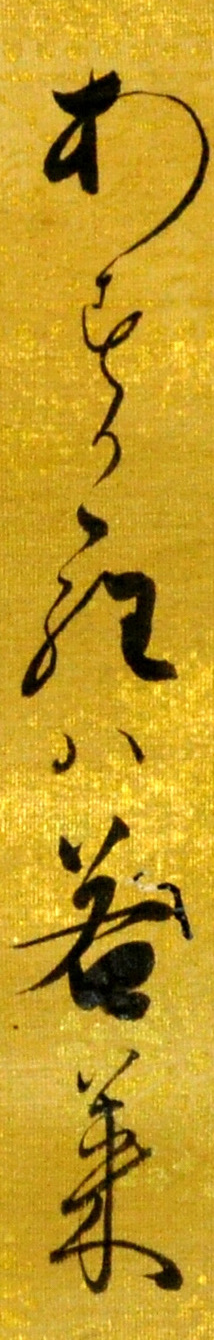あすからは若菜
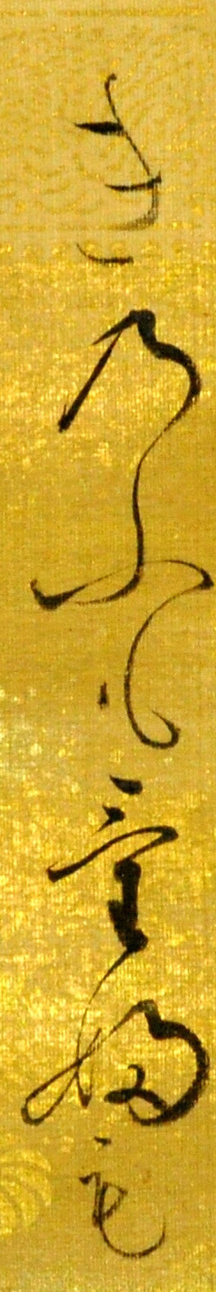きのふもけふも
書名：色紙
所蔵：伊那市立高遠町図書館・合同会社AMANE
